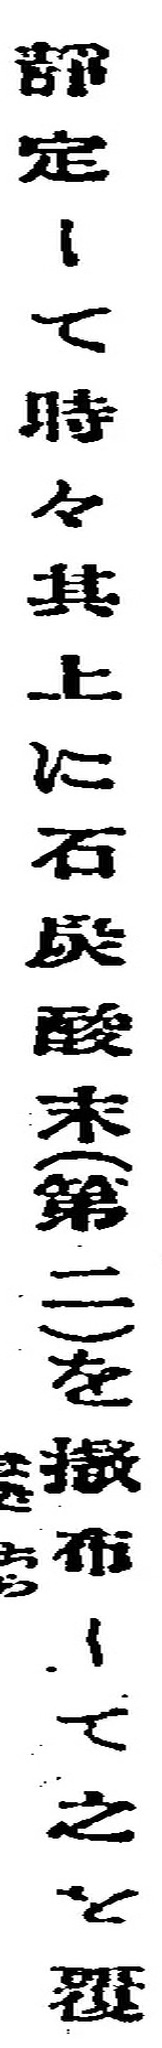静定して時々其上に石炭酸末(第二)を撒布して之を覆
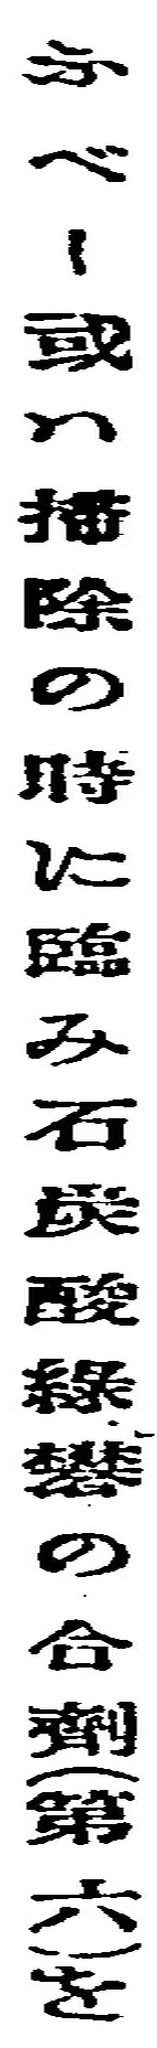ふべし或は掃除の時に臨み石炭酸緑礬の合剤(第六)を
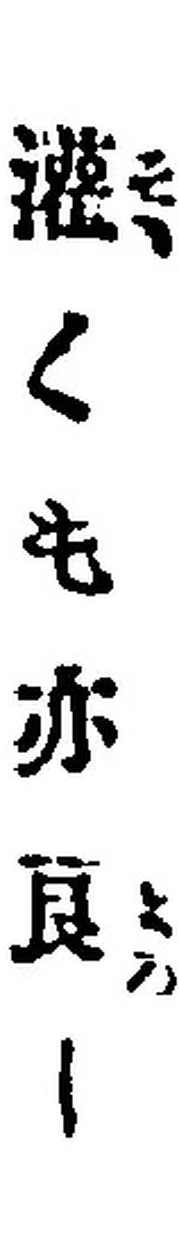灌くも亦良し
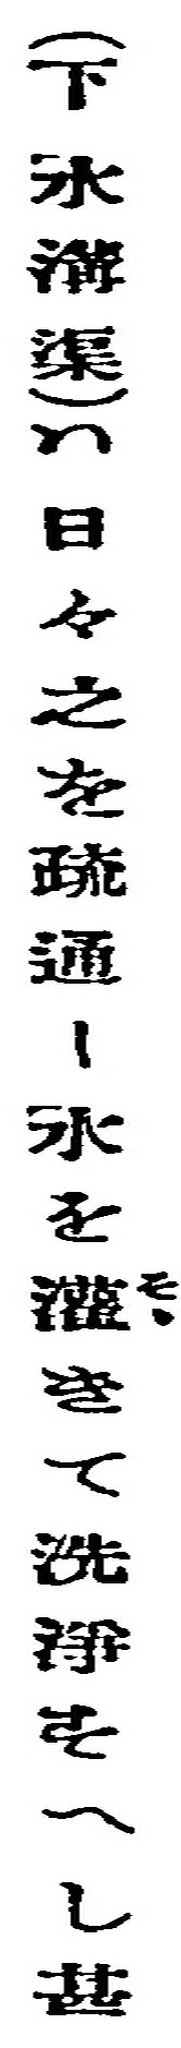(下水溝渠)は日々之を疎通し水を灌きて洗浄すへし甚
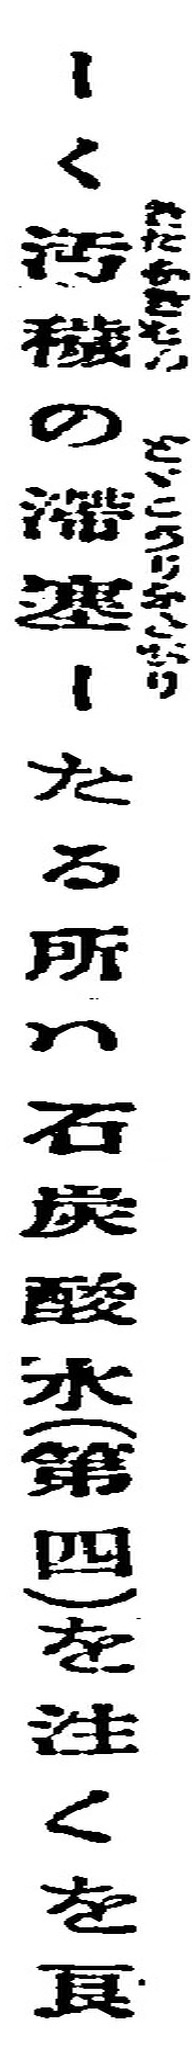しく汚穢の滞塞したる所は石炭酸水(第四)を注くを良

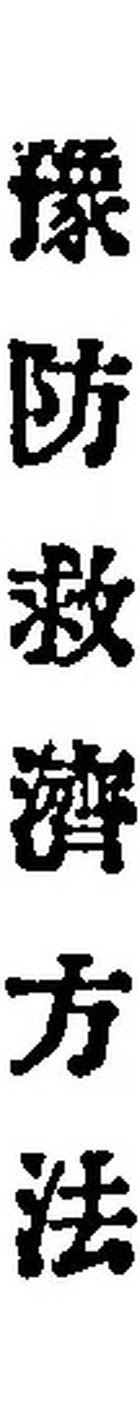予防救済方法
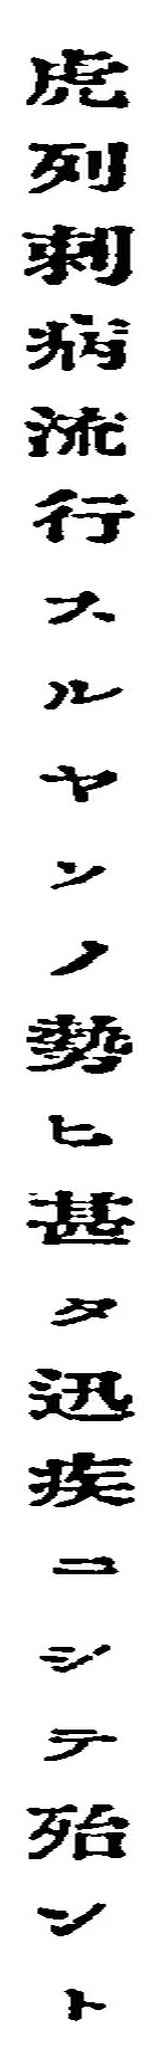虎列刺病流行スルヤソノ勢ヒ甚タ迅疾ニシテ殆ント
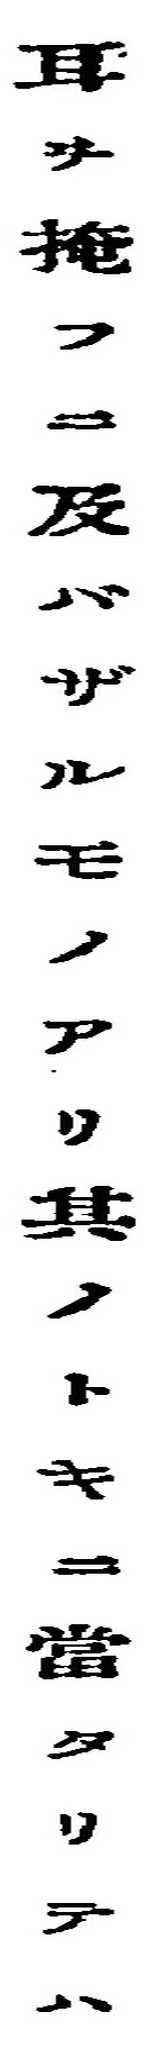耳ヲ掩フニ及バザルモノアリ其ノトキニ当タリテハ
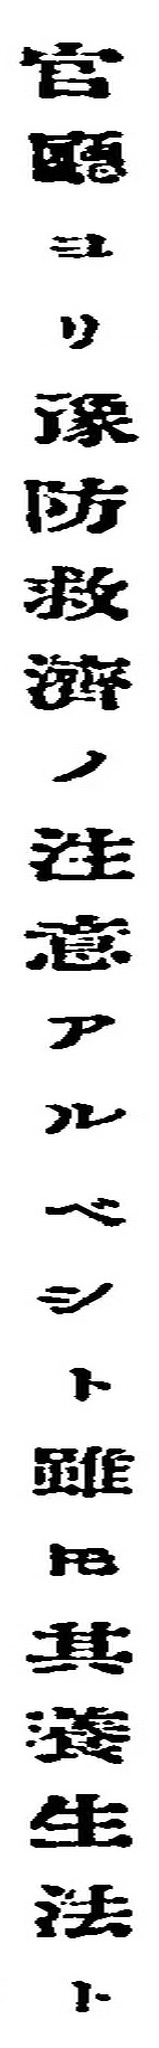官庁ヨリ予防救済ノ注意アルベシト雖トモ其養生法ト
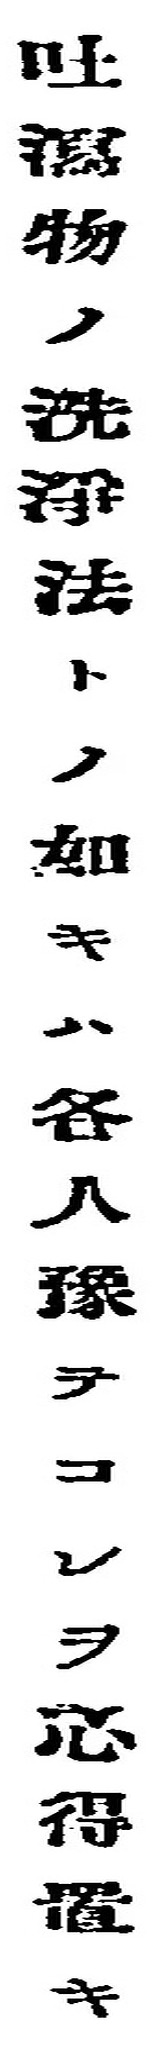吐瀉物ノ洗浄法トノ如キハ各人予テコレヲ心得置キ
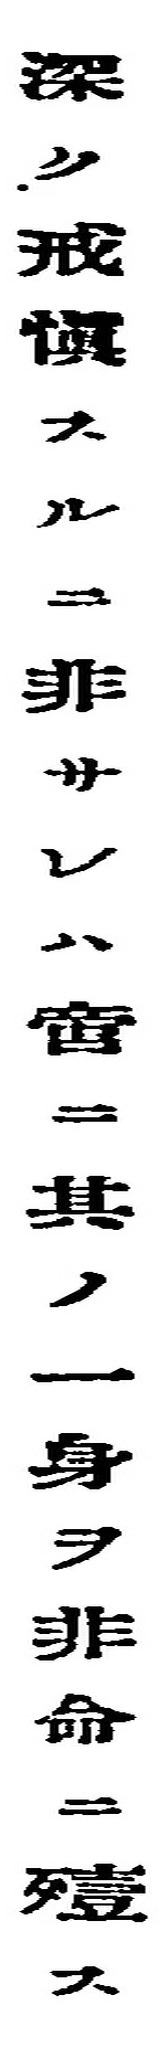深ク戒慎スルニ非サレハ啻ニ其ノ一身ヲ非命ニ殪ス
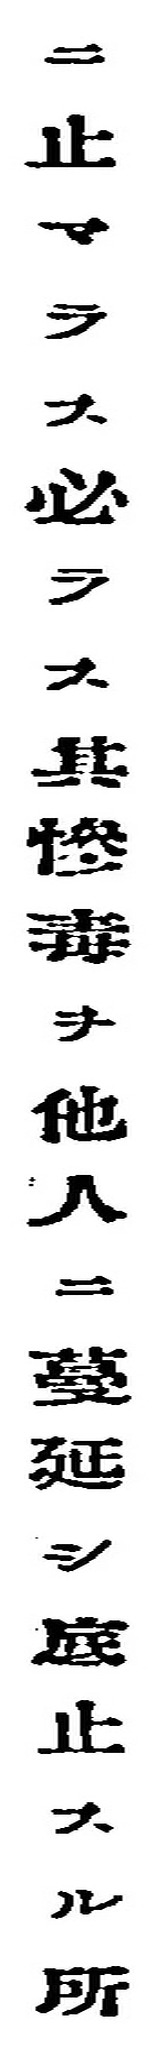ニ止マラス必ラス其惨毒ヲ他人ニ蔓延シ底止スル所
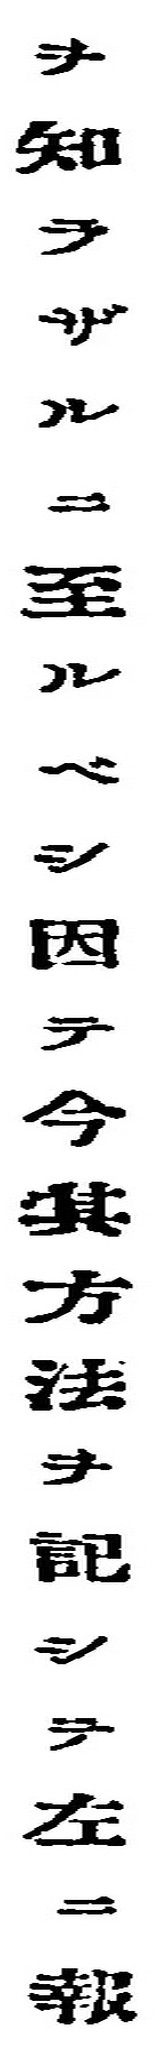ヲ知ラザルニ至ルベシ因テ今其方法ヲ記シテ左ニ報
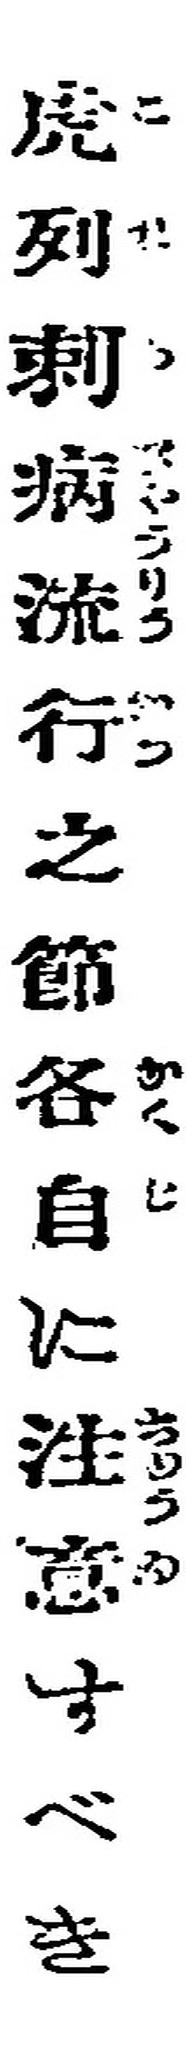虎列刺病流行之節各自に注意すべき
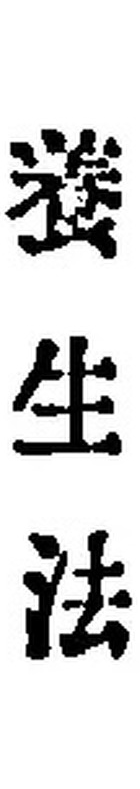養生法
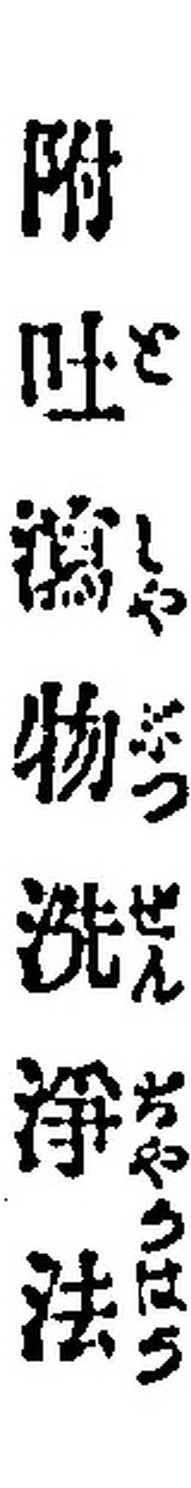附吐瀉物洗浄法
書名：これら病予防心得
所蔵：国立国会図書館 National Diet Library, JAPAN
